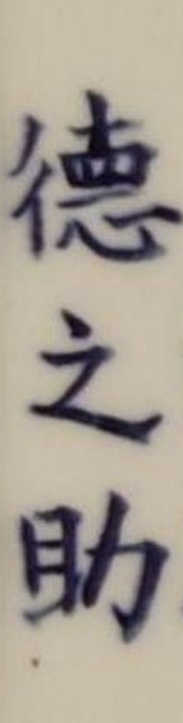徳之助

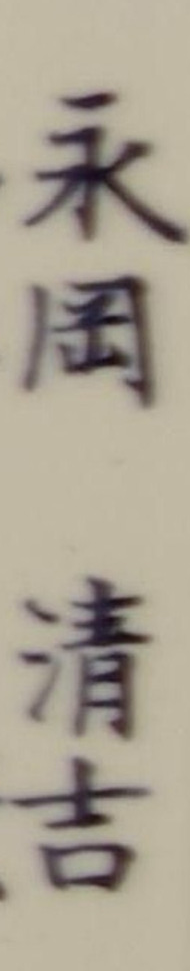永岡清吉
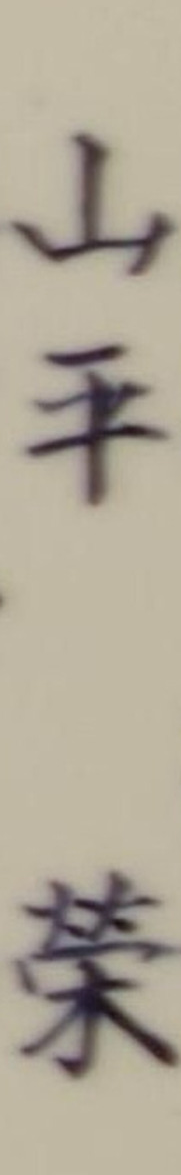山平榮
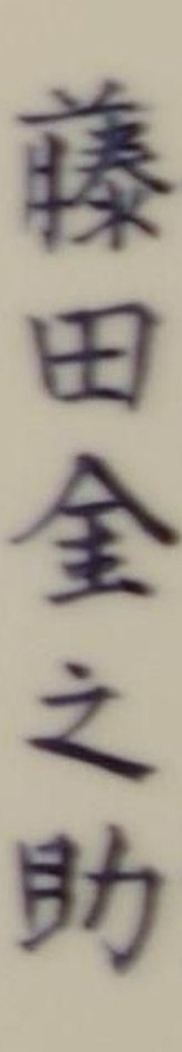藤田金之助
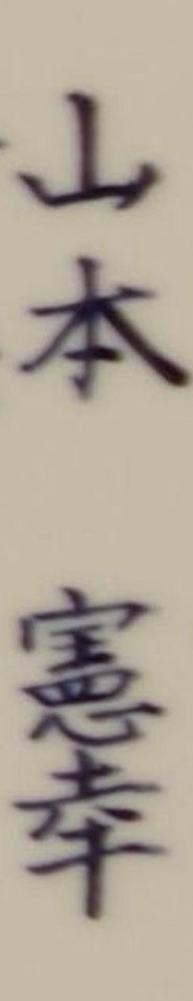山本憲幸
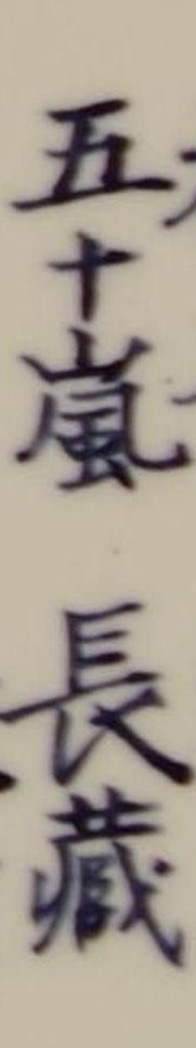五十嵐長蔵
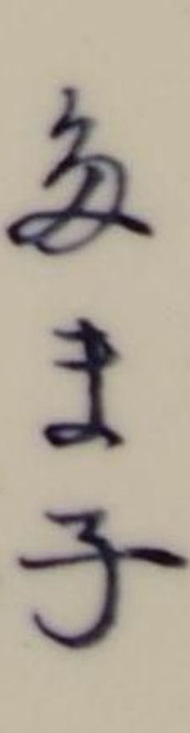たま子
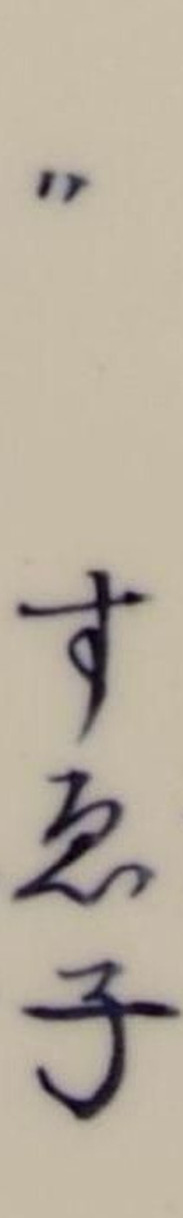すえ子
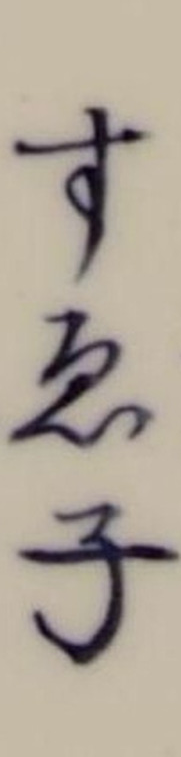すえ子
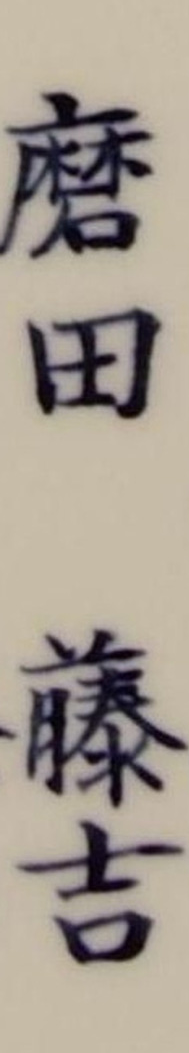磨田藤吉
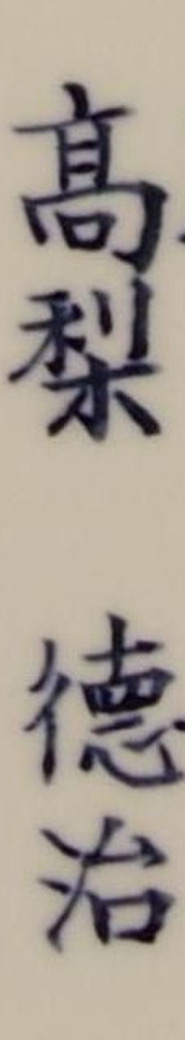高梨徳治
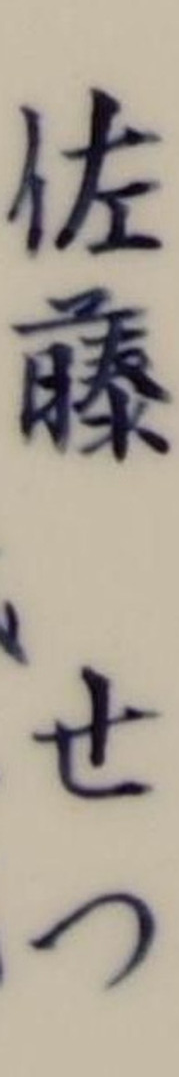佐藤せつ
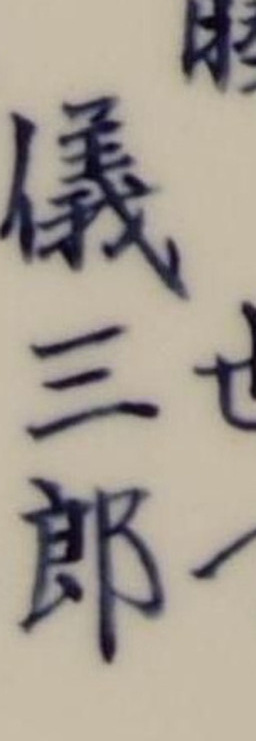儀三郎
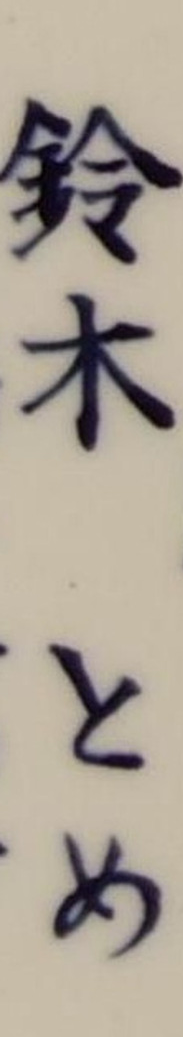鈴木とめ
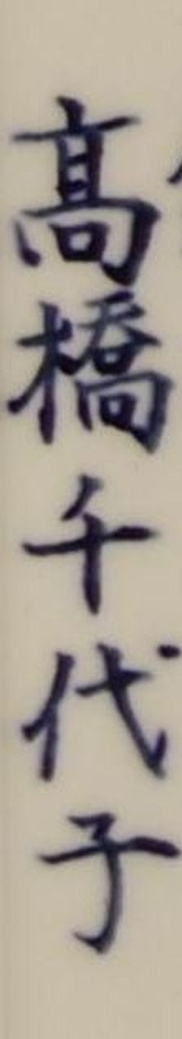高橋千代子

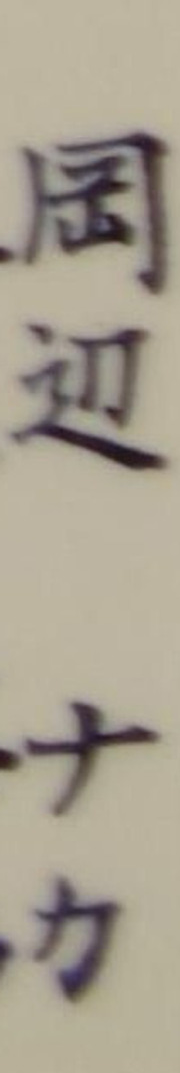岡辺ナカ
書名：M~S
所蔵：高野山金剛峯寺
